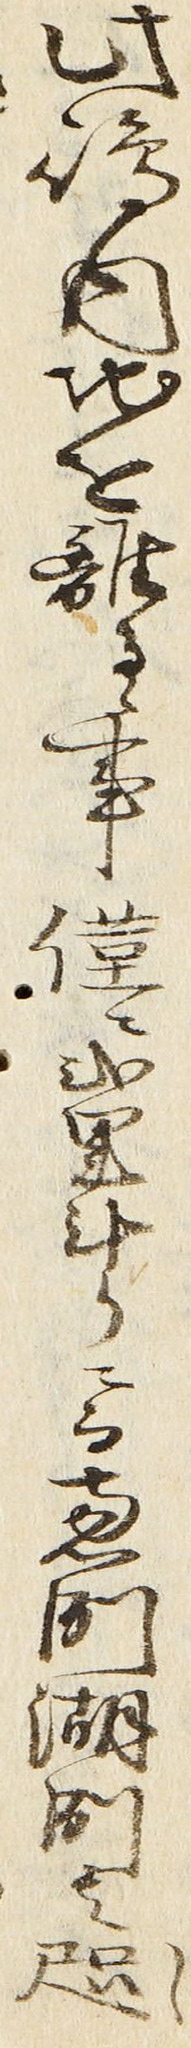此島内地を離るゝ事僅ニ弐里計りニ而恵州湖州は咫
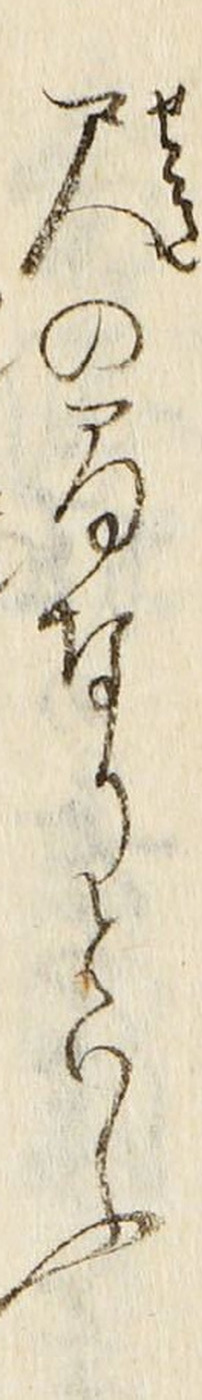尺の間なりといふ
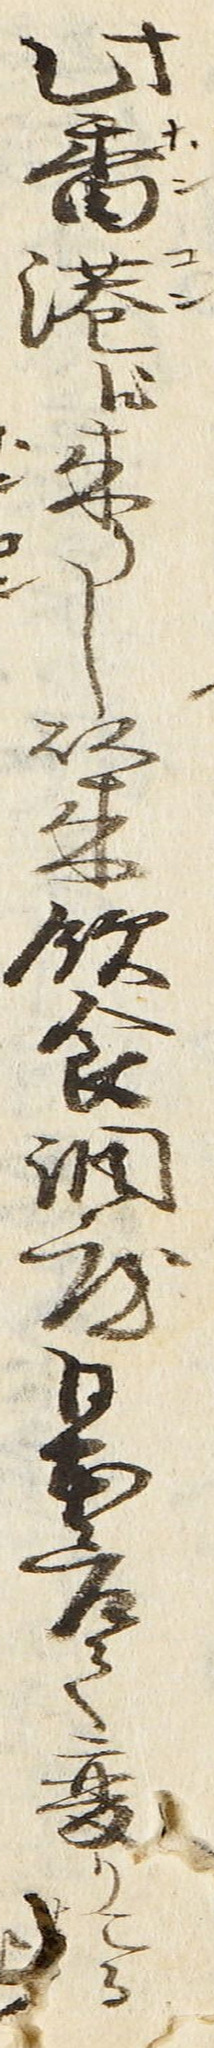此香港江来りし以来飲食調度日本とて変りたる
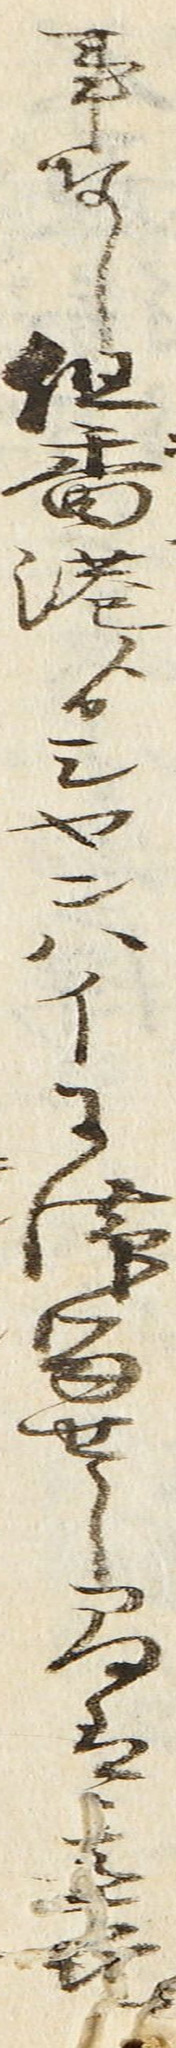事なし但香港ゟシヤンハイに滞留せし間は其地
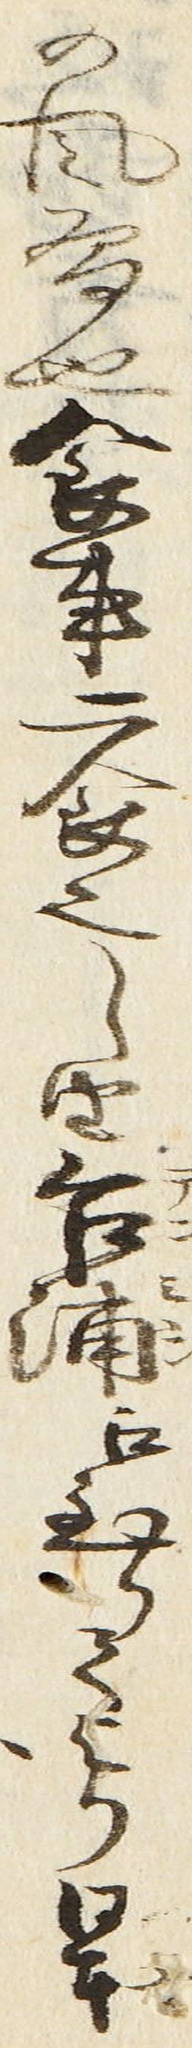の風習也食事二食也し由乍浦え至りてより日本
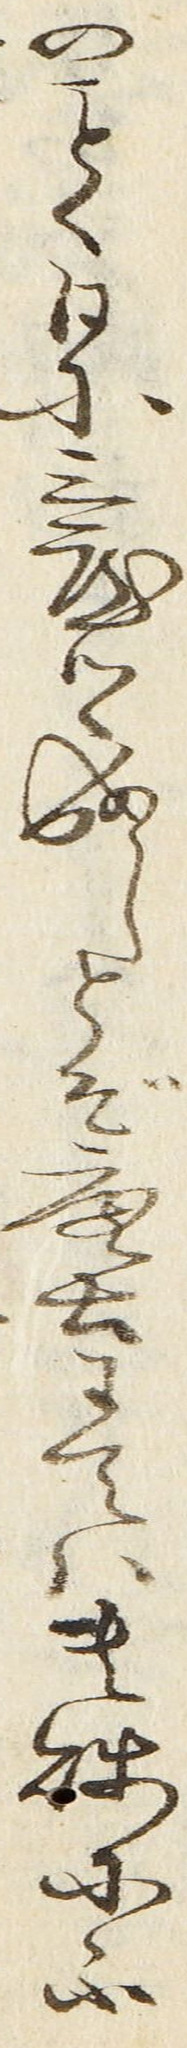のことく日に三度ツヽ成しとぞ唐土にてハ貴賤に不
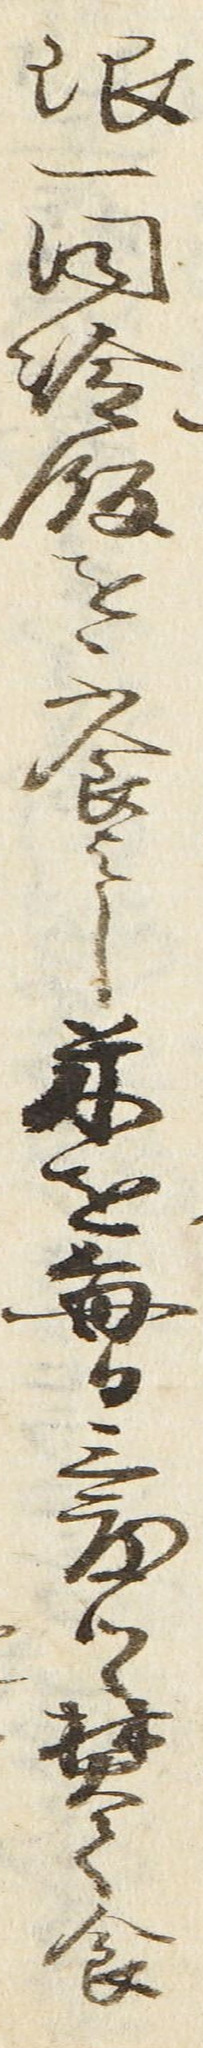限一同冷飯を不食よし米を毎日三度ツヽ焚て食
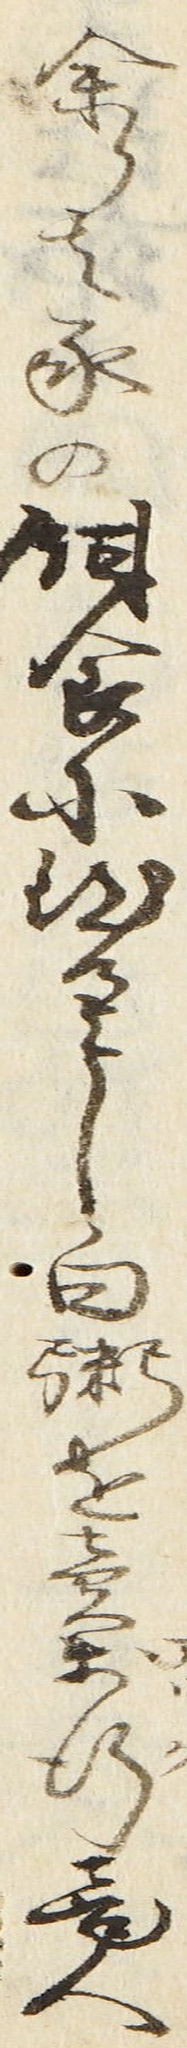余りは豕の餌食に致るよし白粥を売歩行商人
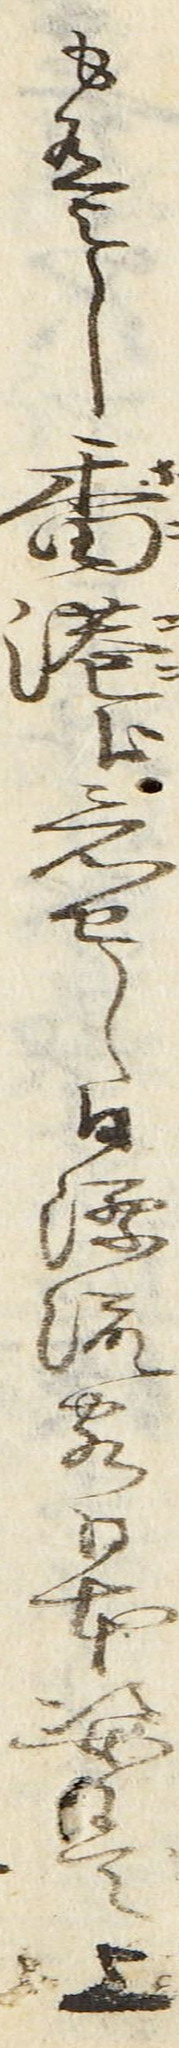も有よし香港え着せし日漂流客日本姿にて上
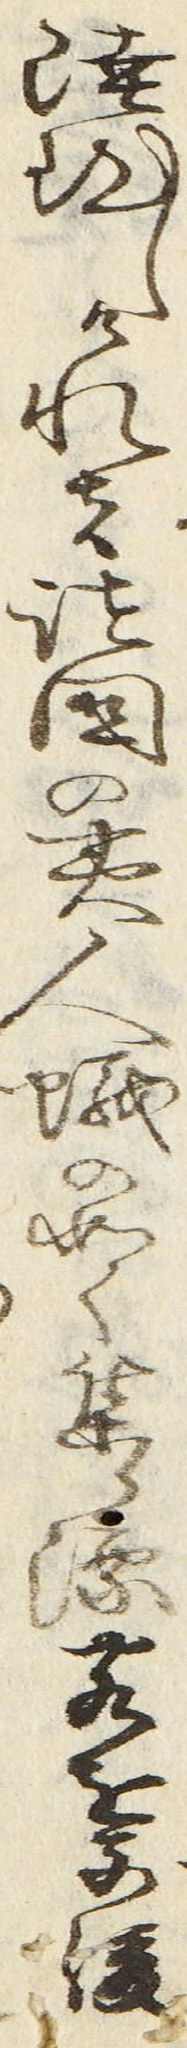陸致しけれは諸国の夷人蟻の如く集り漂客を前後
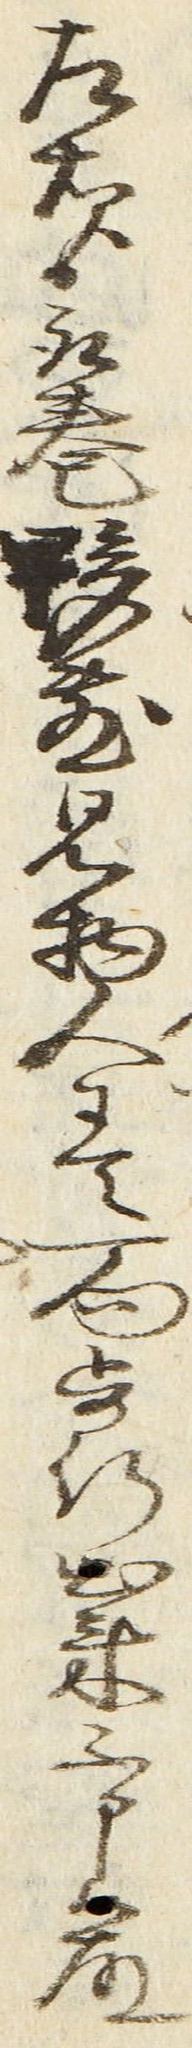左右ゟ取巻夥敷見物人にて一向歩行出来不申候故
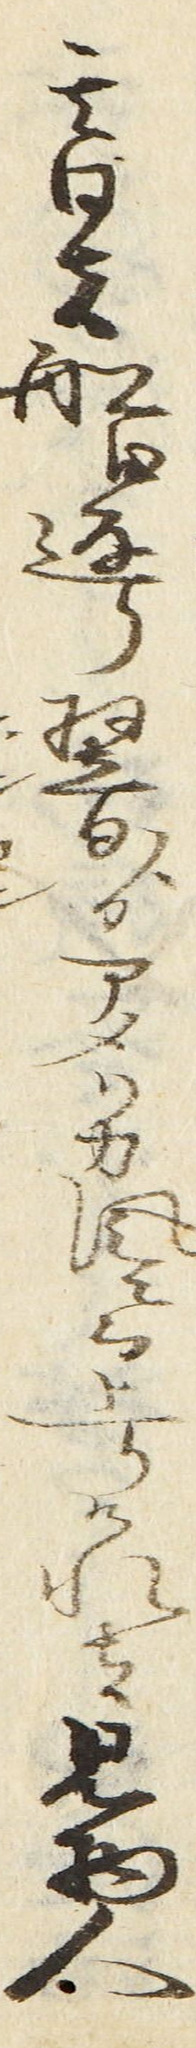其日は者船え返り翌日ゟアメリカ風ニ而上りけれは見物人
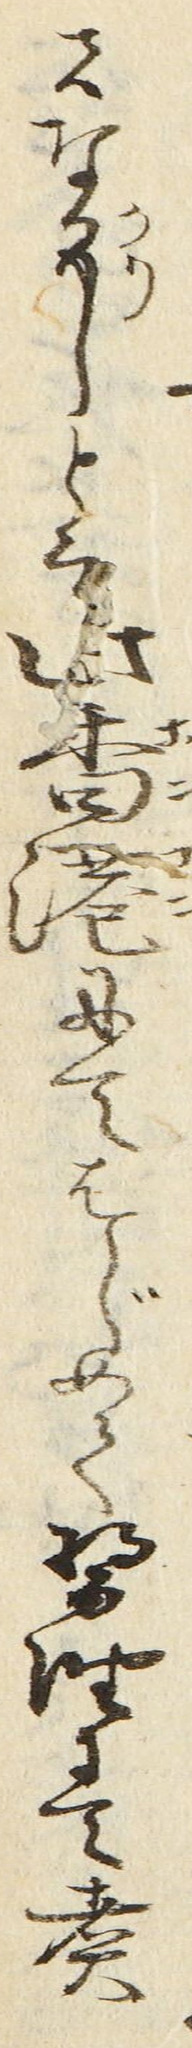はなかりしとそ此香港にてはじめて醤油にて煮

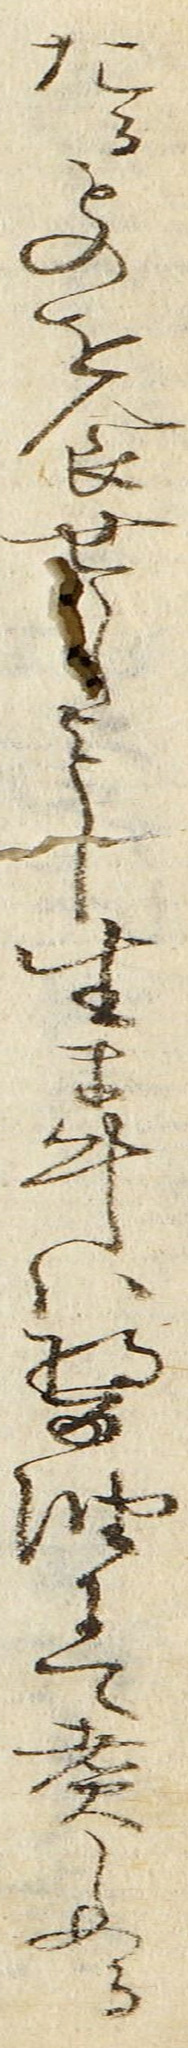たるものを食せしよし生ま牛ハ醤油煮しめる
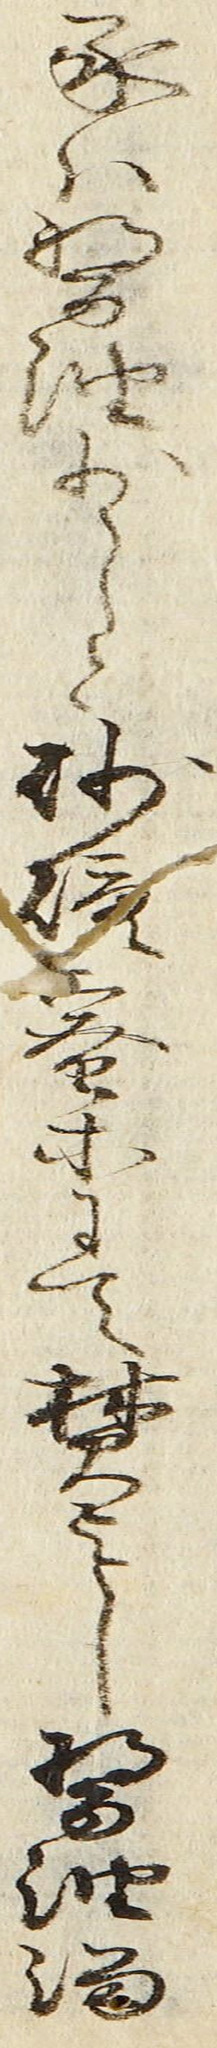豕ハ醤油少しと砂糖蜜等にて焚よし醤油溜
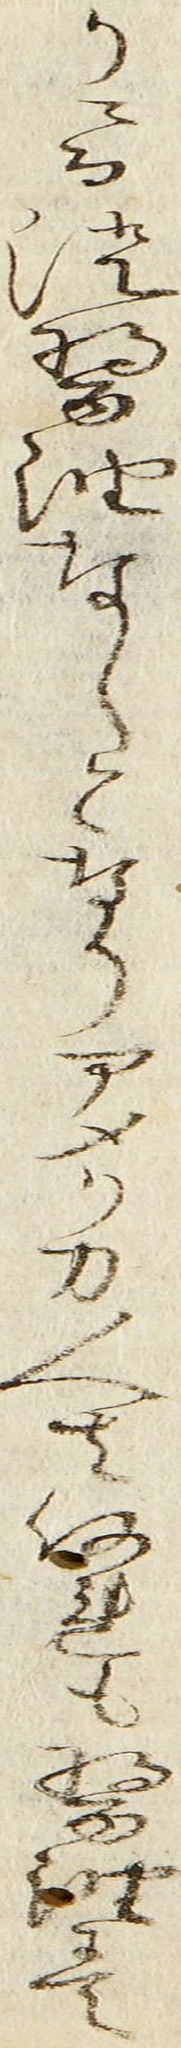りニ而澄醤油なしとなりアメリカ人は何れも醤油にて
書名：亜墨利加漂流記聞
